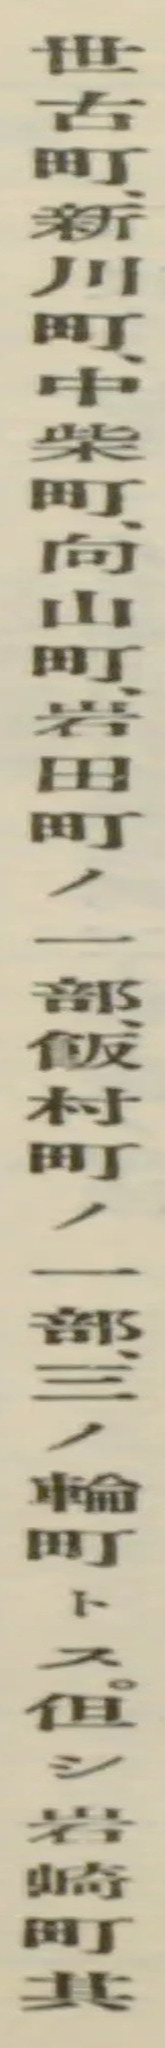世古町、新川町、中柴町、向山町、岩田町の一部、飯村町の一部、三の輪町とす。但し岩崎町其
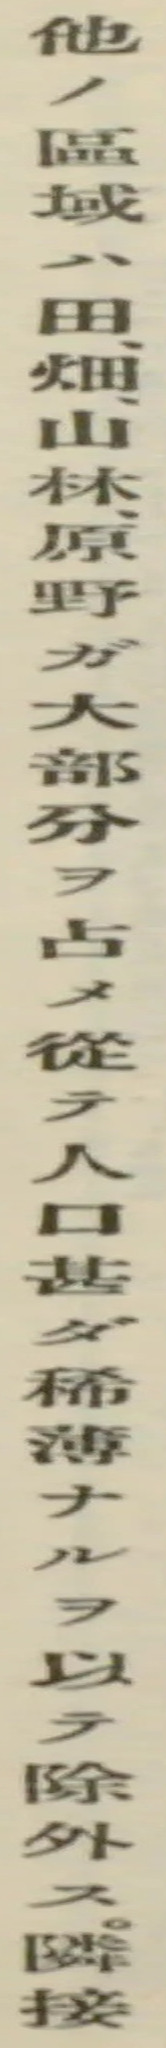他の区域は田、畑、山林、原野が大部分を占め従て人口甚だ希薄なるを以て除外す。隣接
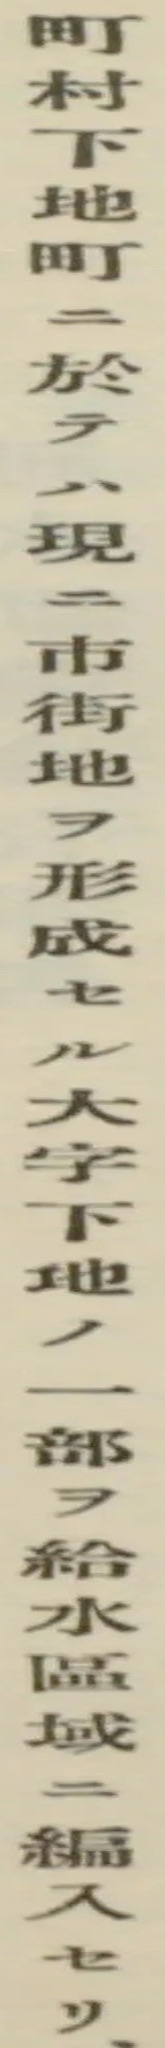町村下地町に於いて現に市街地を形成せる大字下地の一部を給水区域に編入せり、
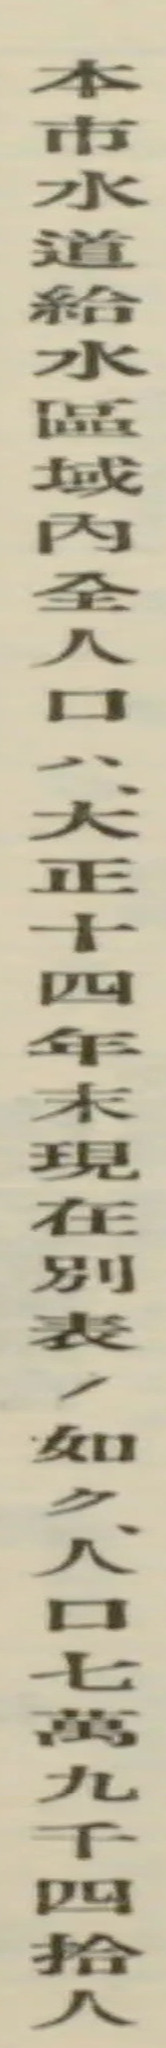本市水道給水区域内全人口は、大正じゅ十四年末現在別表の如く、人口七萬九千四拾人
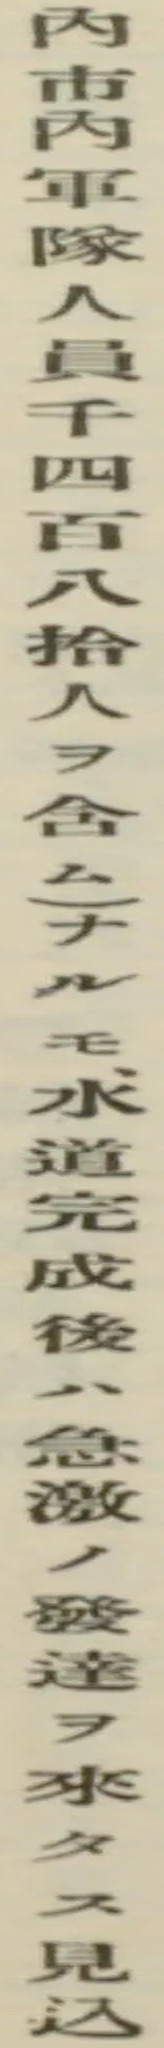内市内軍隊人員千四百八拾人を含む)なるも、水道完成後は急激の発達を来たす見込
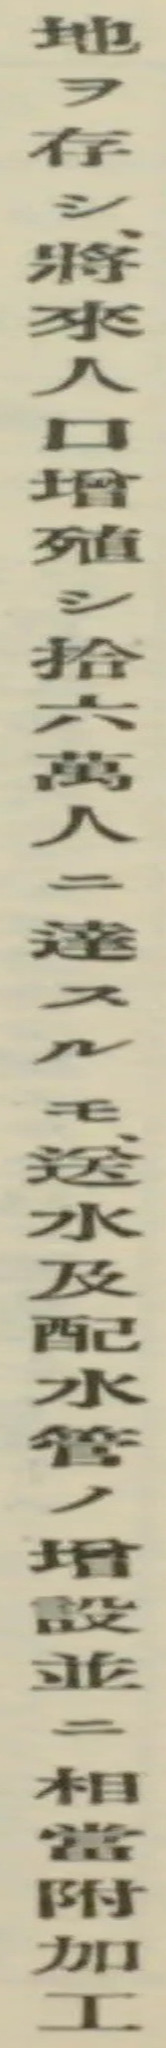地を存し、将来人口増殖し拾六萬人に達するも、送水及配水管の字増設並に相当附加工
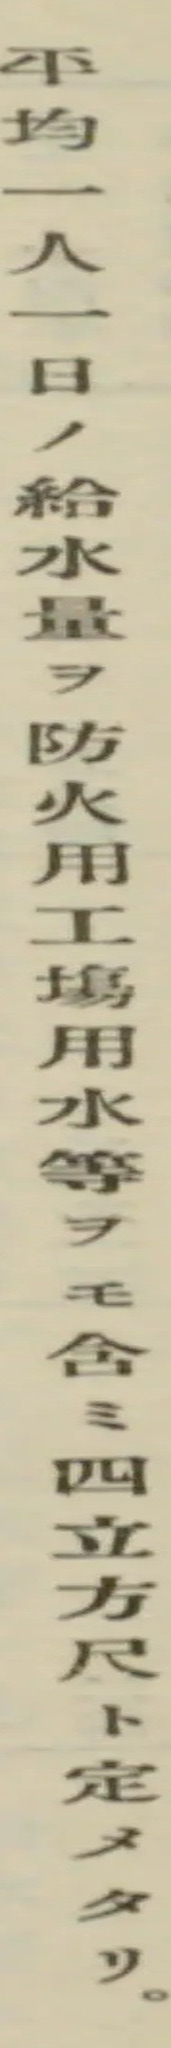平均一人壱日の給水量を防火用工場用水等をも含み四立方尺と定めたり。
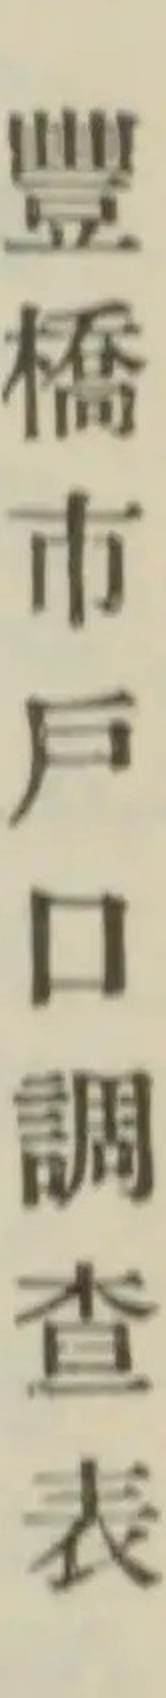豊橋市戸口調査表
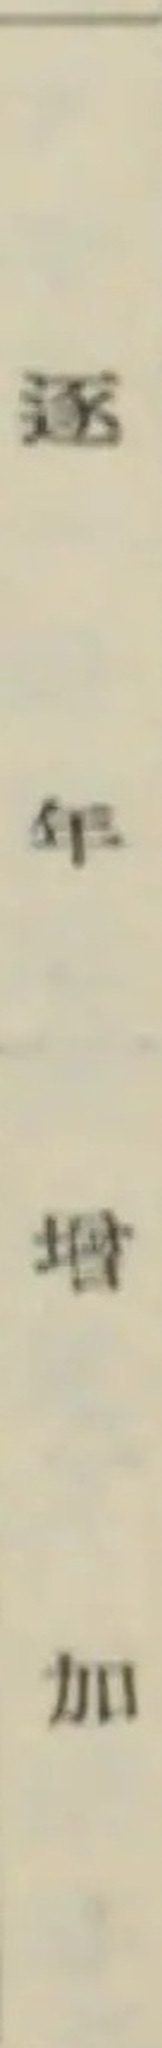逐年増加
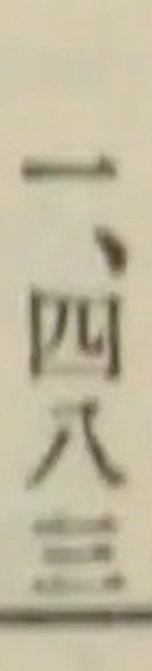一、七三三
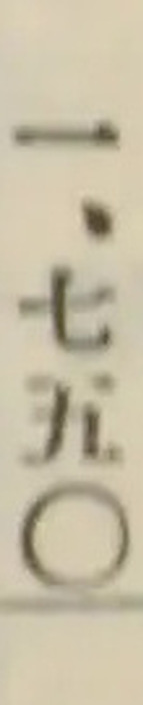一、七三三
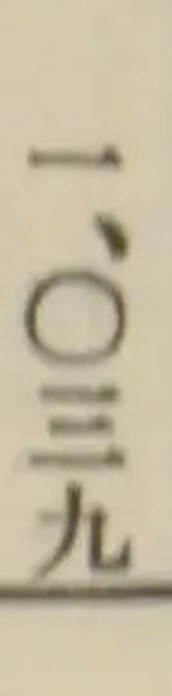一、七三三
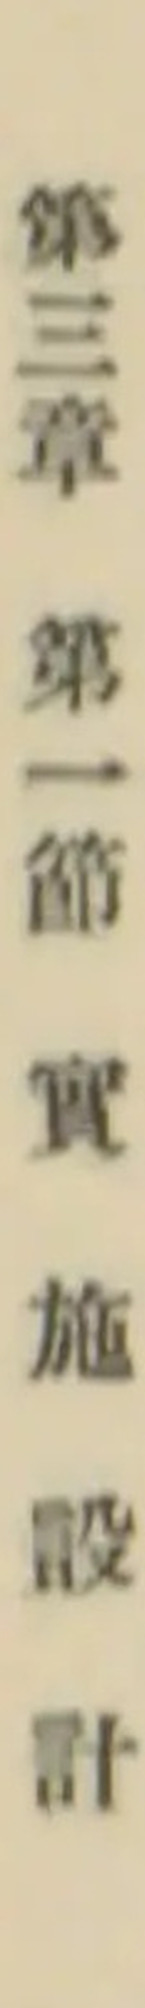第三章第一節実施設計

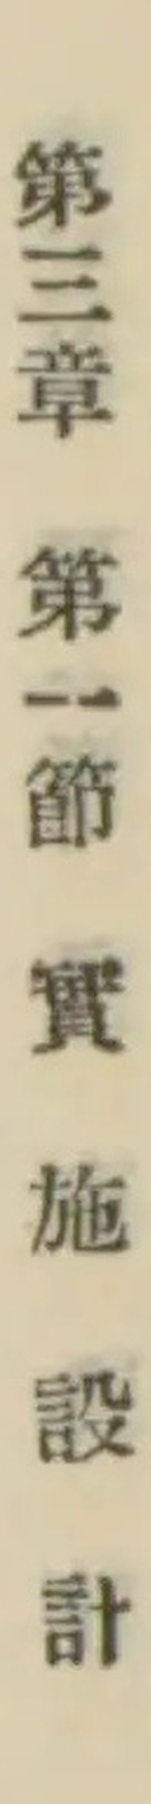第三章第一節実施設計
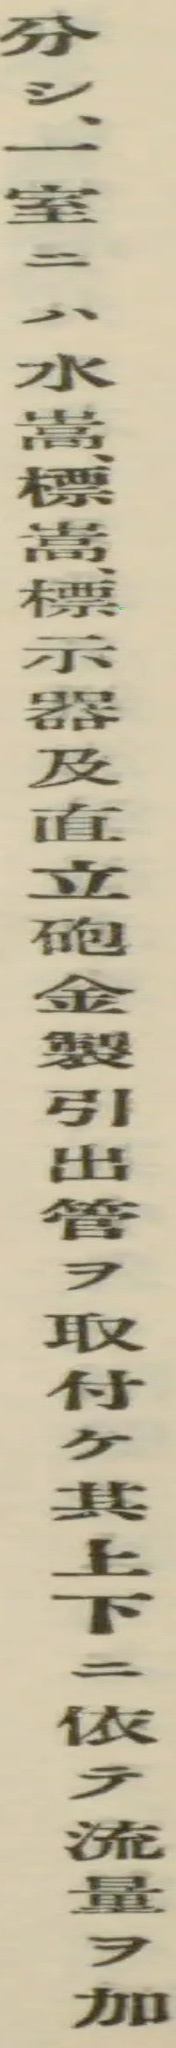分し、一室には水嵩、標嵩、標示器及直立砲金製引出管を取付け其上下に依りて流量を加
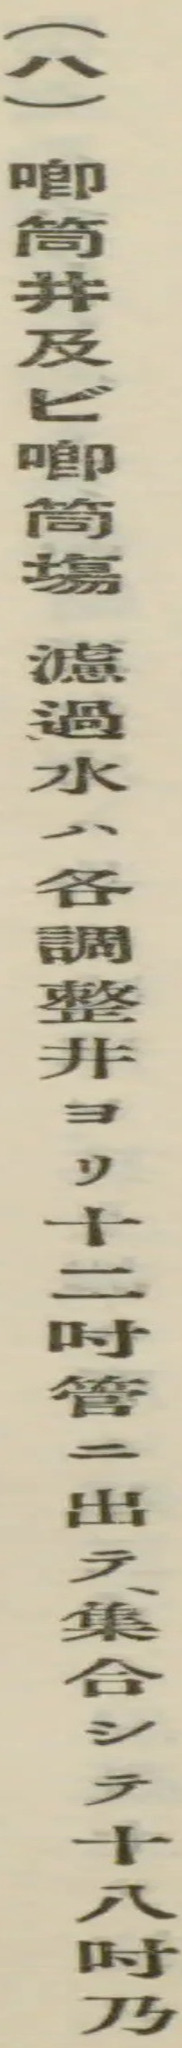(ハ)喞筒井及び喞筒場濾過水は覺各調整井よより十二吋管に出て、集合して十八吋乃
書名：豊橋市水道誌
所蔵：国立国会図書館 National Diet Library, JAPAN
